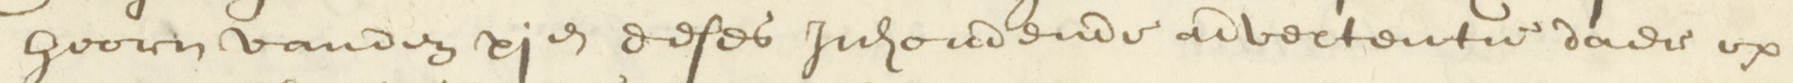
hoorn vanden xie deses Inhoudende advertentie daer op
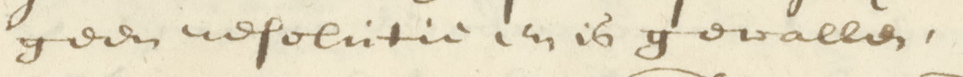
geen resolutie en is gevallen.
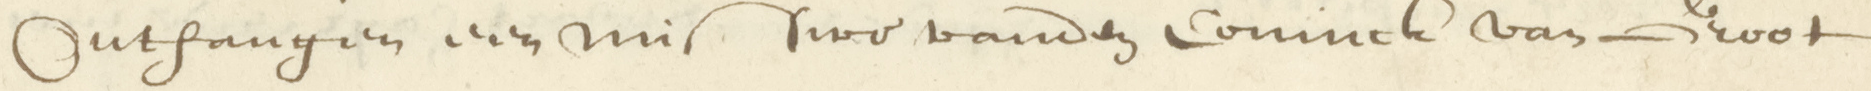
Ontfangen een missive vanden Coninck van Groot
